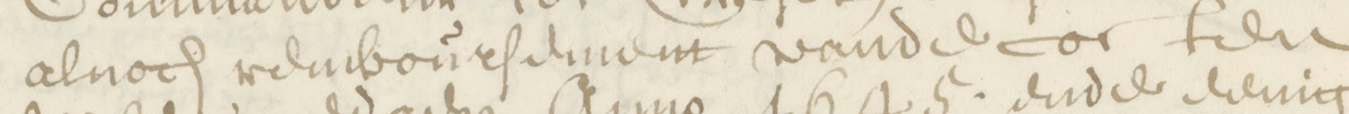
alnoch remboursement vande costen
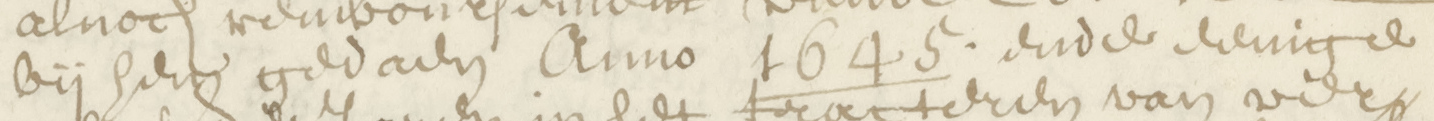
bij hem gedaen Anno 1645 ende eenige
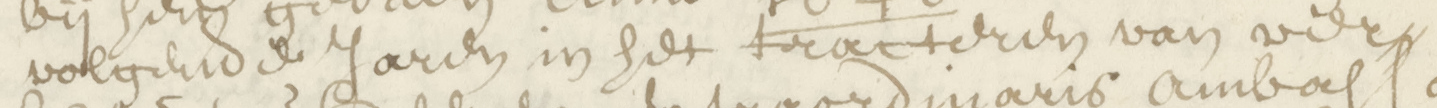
volgende Jaren in het tracteren van ver,,
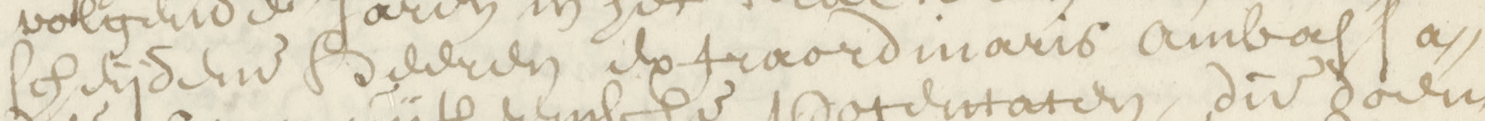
scheijdene Heeren extraordinaris Ambassa,,
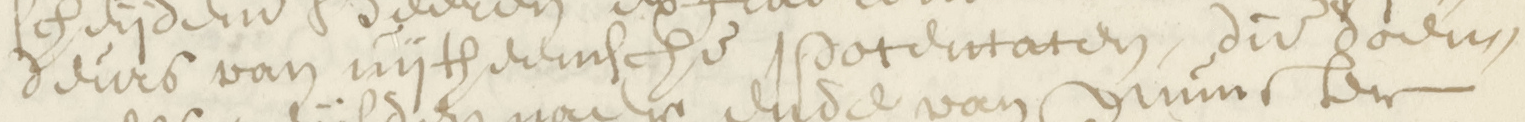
deurs van uijtheemsche potentaten, die doen„
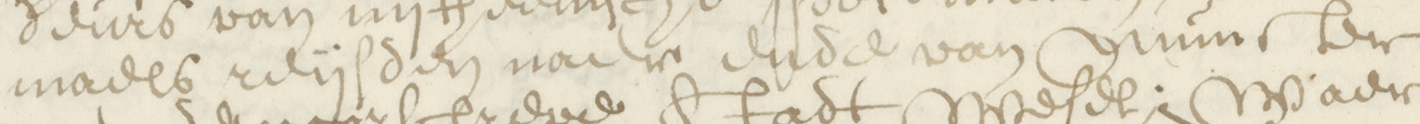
maels reijsden naer ende van Munster
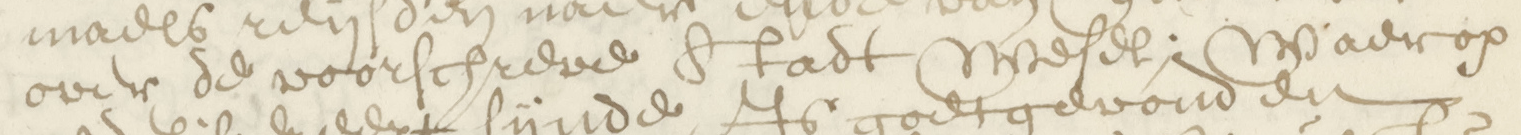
over de voorschreve Stadt Wesel: Waerop
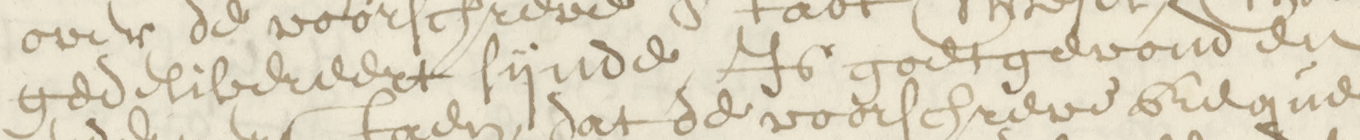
gedelibereert sijnde, Is goetgevonden
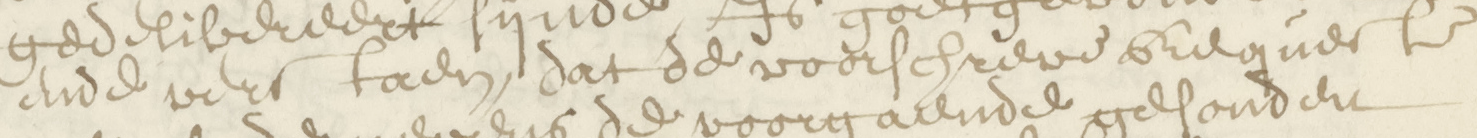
ende verstaen, dat de voorschreve Requeste
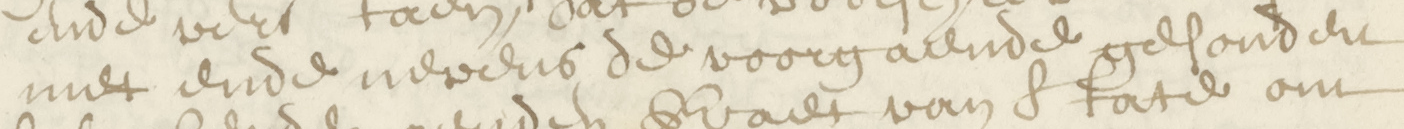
met ende nevens de voorgaende gesonden
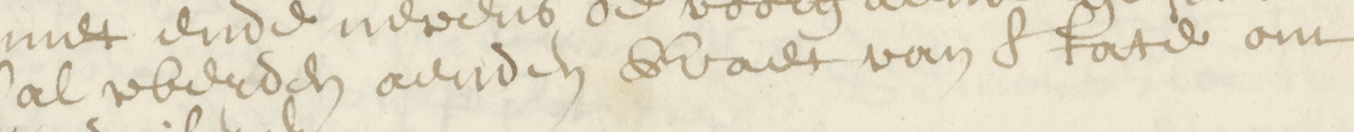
sal werden aenden Raet van State om
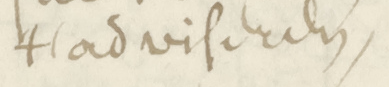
t'adviseren.
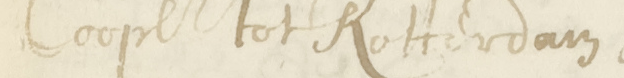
Coopl tot Rotterdam
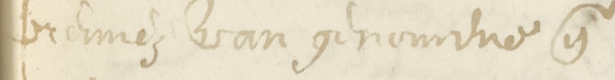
Premien van genomene ende
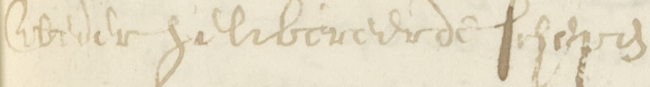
weder gelibereerde schepen
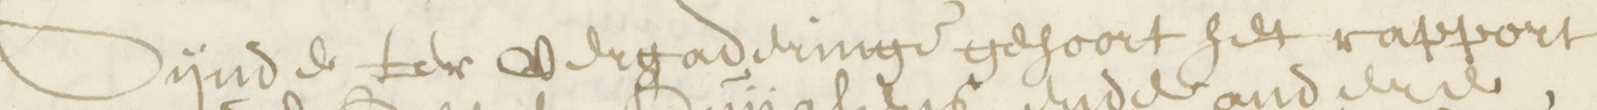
Sijnde ter Vergaderinge gehoort het rapport
